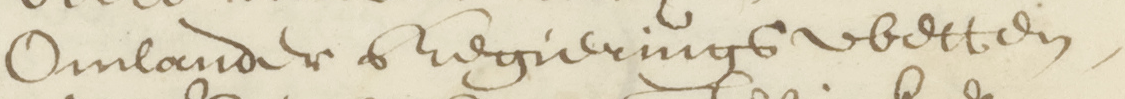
Omlander Regierings wetten,
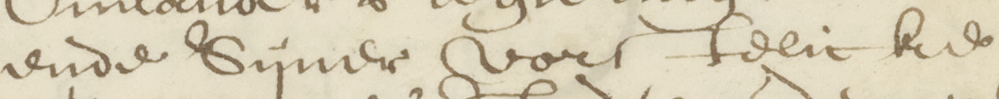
ende Sijner vorstelicke
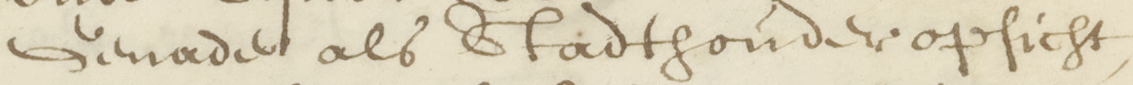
Genade als Stadthouder opsicht,
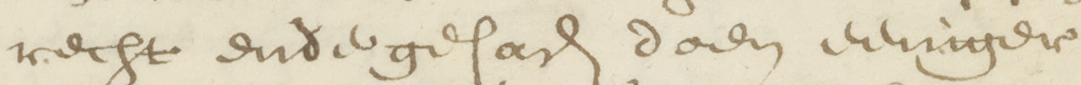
recht ende gesach doen eeniger
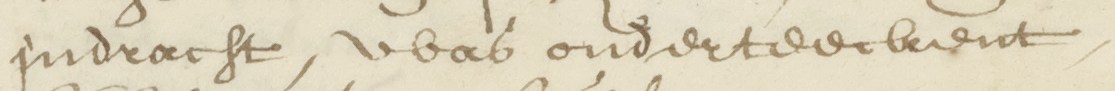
indracht, was onderteeckent
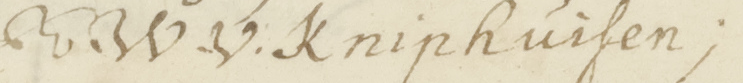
R. W. V. Kniphuisen
